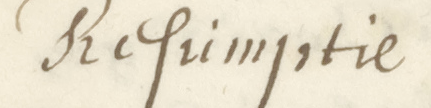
Resumptie
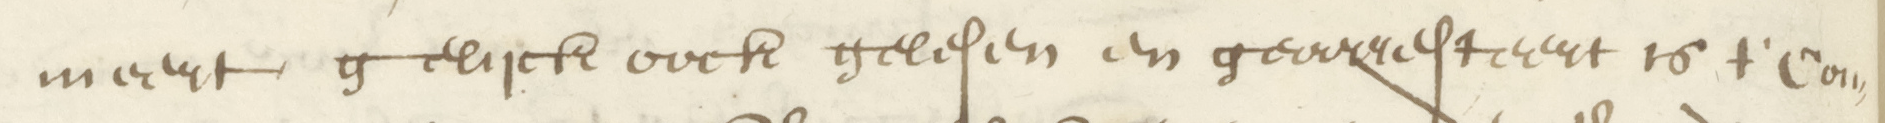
meert, gelyck oock gelesen en gearresteert is t'Con,,
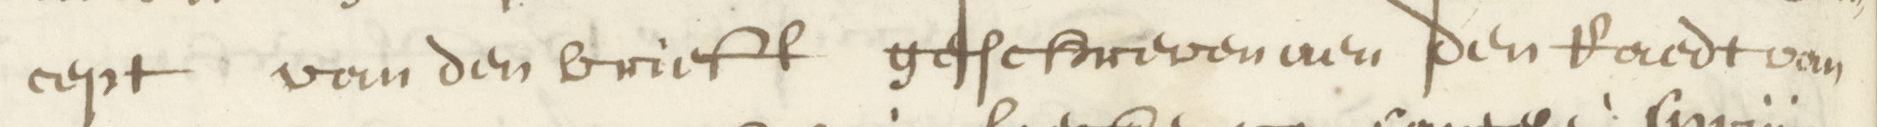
cept van den brieff geschreven aen den Raedt van
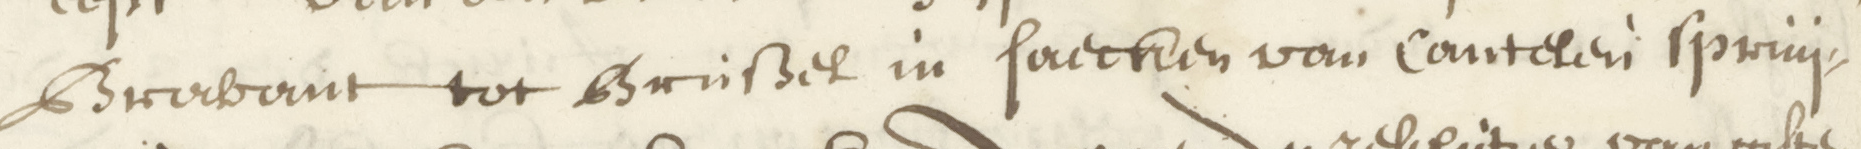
Brabant tot Brussel in saecken van Canteleu spruij„
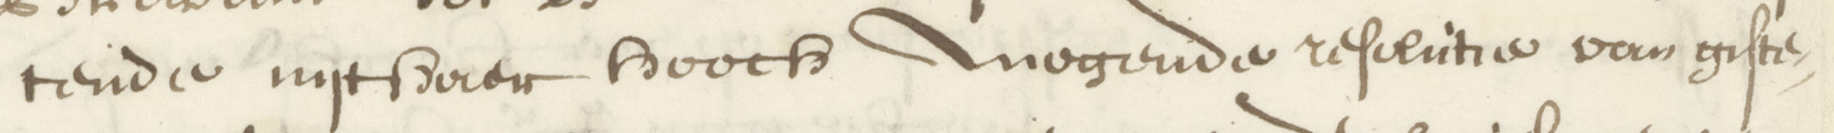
tende uyt Haer Hooch Mogende resolutie van giste„
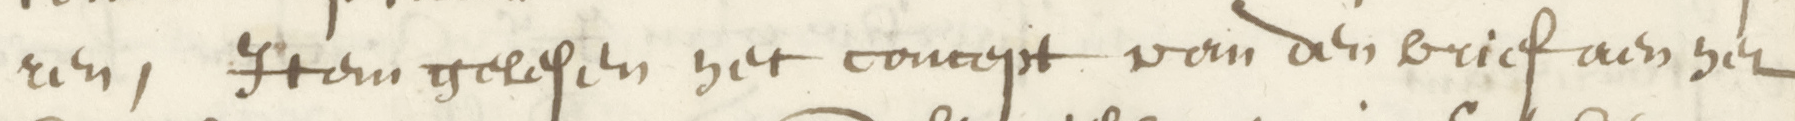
ren. Item gelesen het concept van den brief aen het
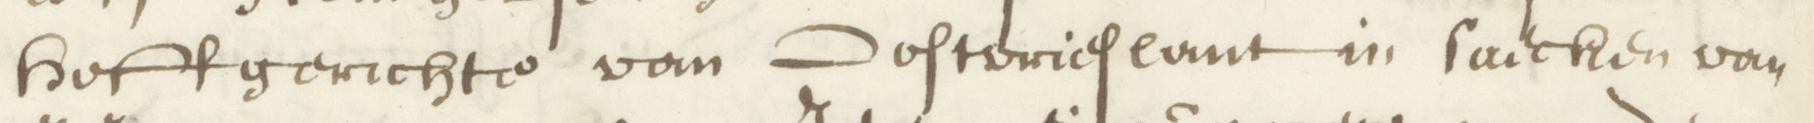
Hoffgerichte van Oostvrieslant in saecken van
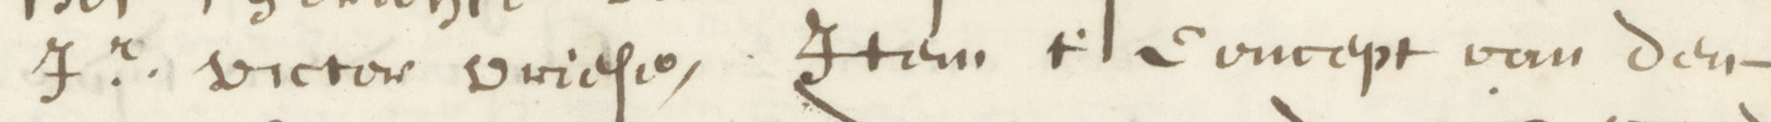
Jr. Victor Vriese. Item t'Concept van den
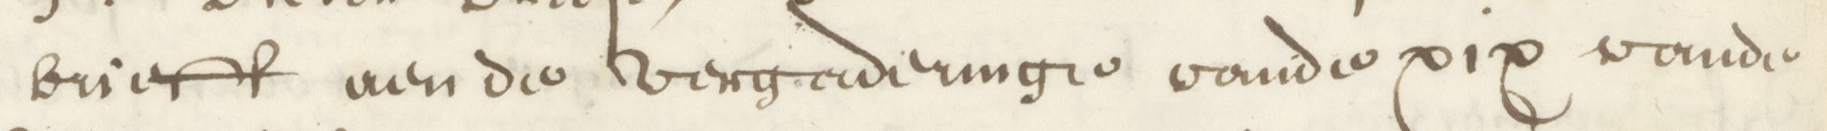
brieff aen de vergaderinge vande xix vande
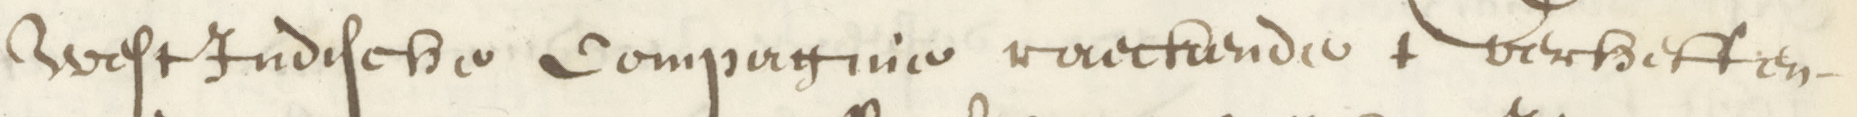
WestIndische Compagnie raeckende t verheffen
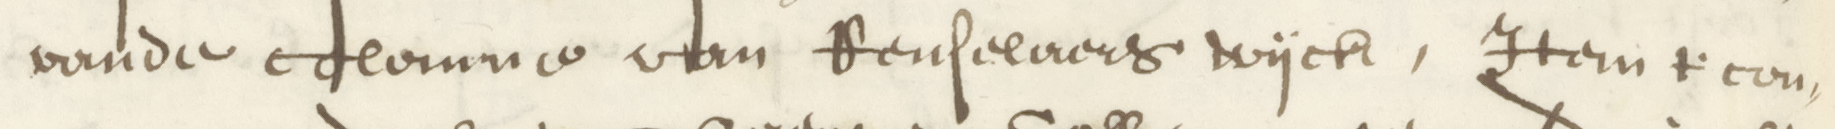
vande colonne van Renselaers wijck. Item t' con„
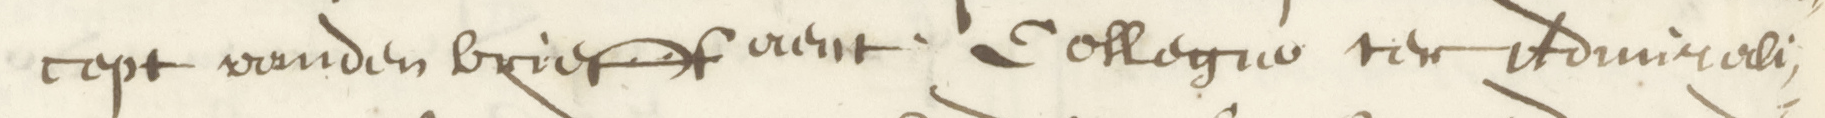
cept vanden briefff aent' Collegie ter Admirali,
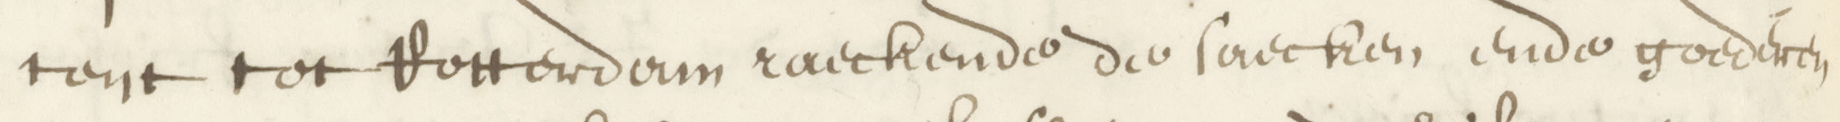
teyt tot Rotterdam raeckende de saecken ende goederen
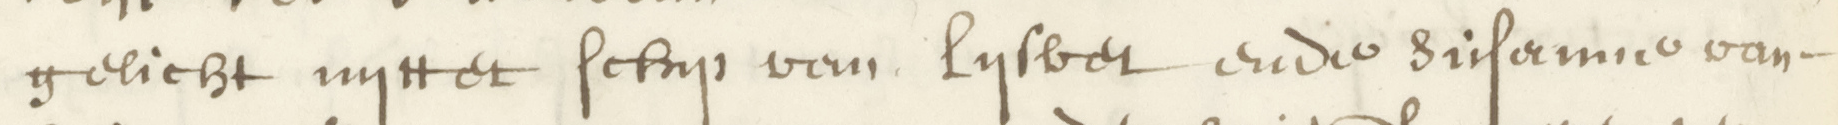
gelicht uyttet schip van Lysbet ende susanne van
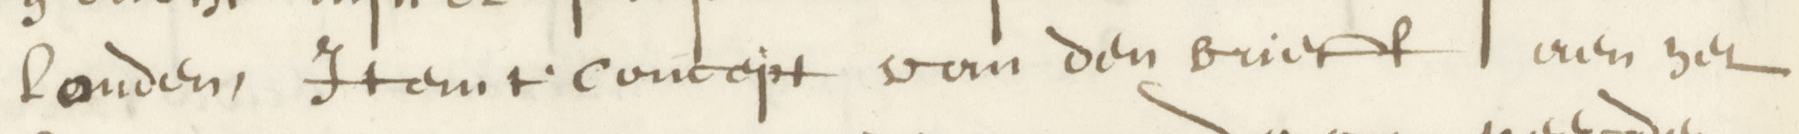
Londen. Item t' concept van den brieff aen het
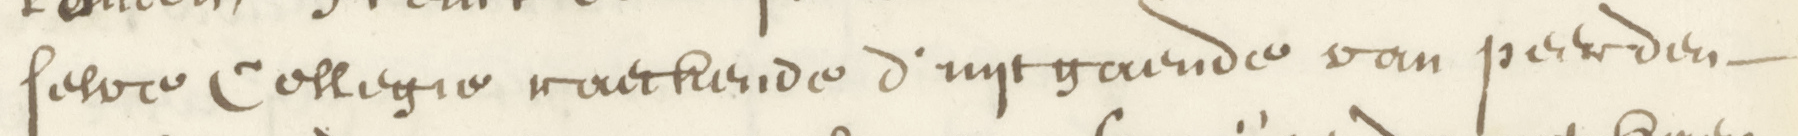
selve Collegie raeckende d'uytgaende van peerden —
